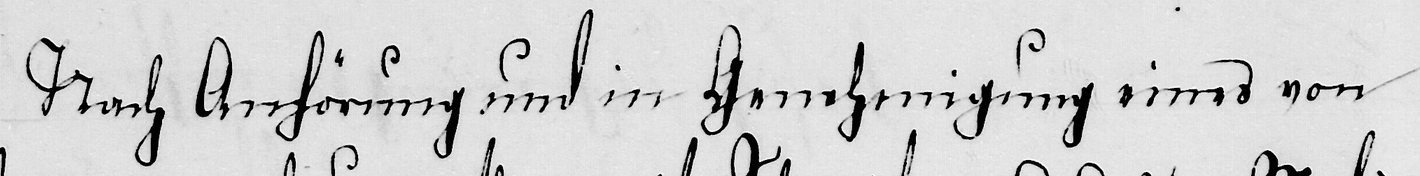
Nach Anhörung und in Genehmigung eines von
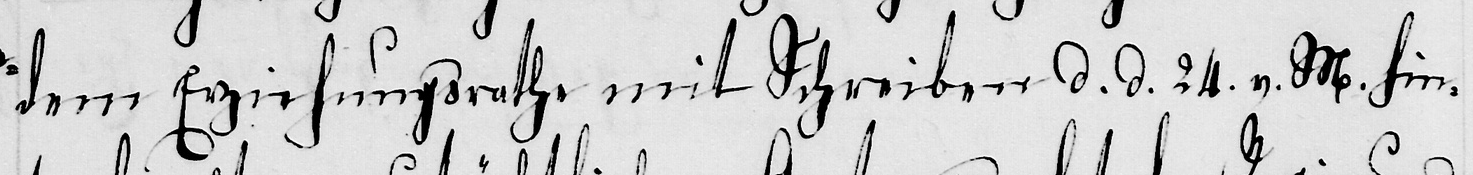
dem Erziehungsrathe mit Schreiben d. d. 24. v. M. hin¬
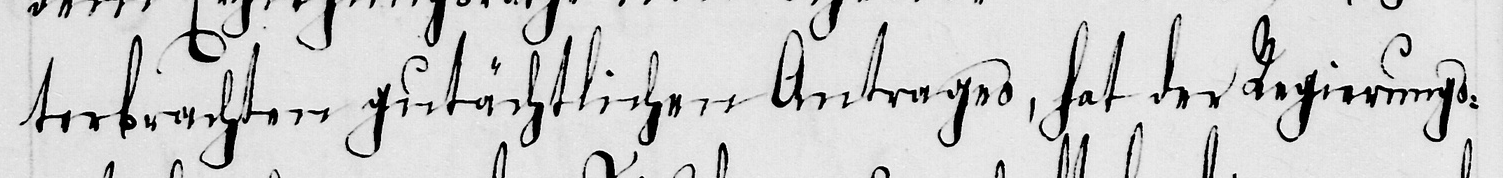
terbrachten gutächtlichen Antrages, hat der Regierungs¬
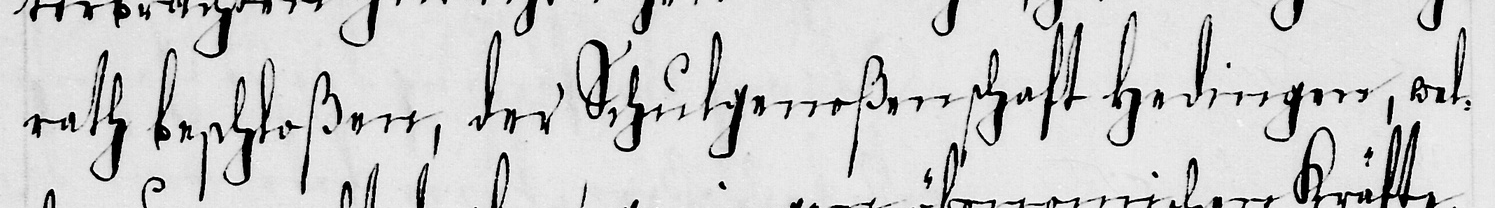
rath beschloßen, der Schulgenoßenschaft Hedingen, wel¬
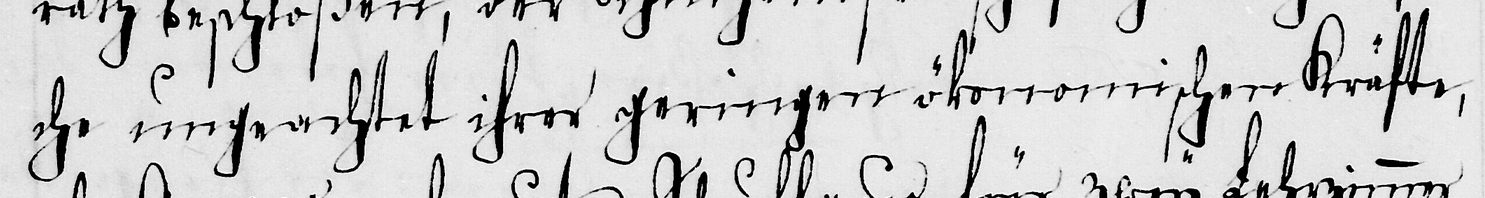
che ungeachtet ihrer geringen ökonomischen Kräfte,
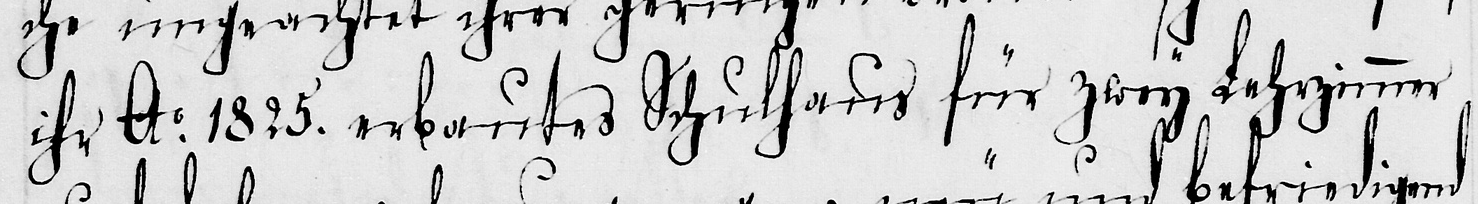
ihr Ao. 1825. erbautes Schulhaus für zwey Lehrzimmer
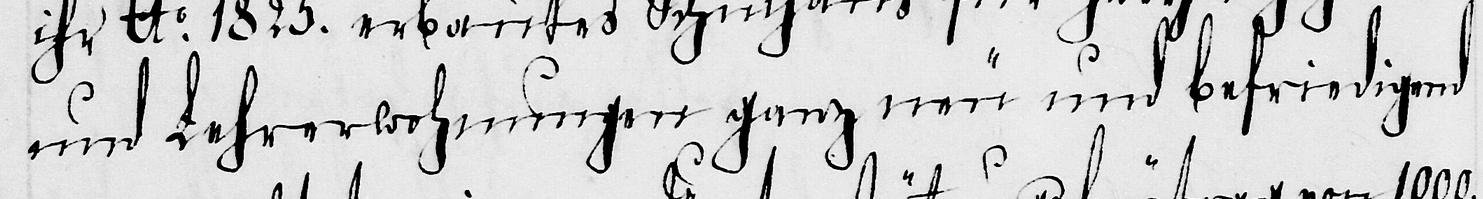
und Lehrerwohnungen ganz neu und befriedigend
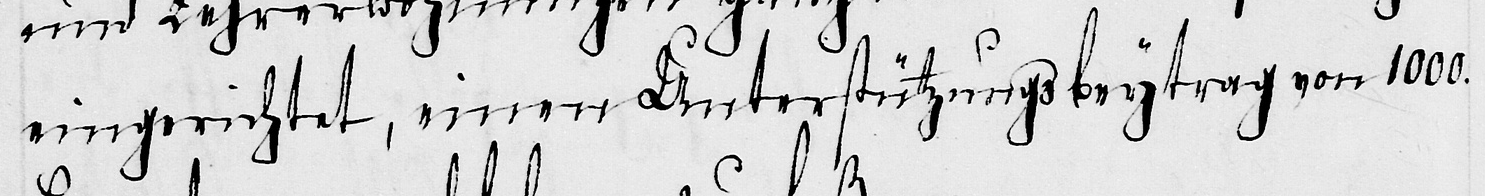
eingerichtet, einen Unterstützungsbeytrag von 1000.
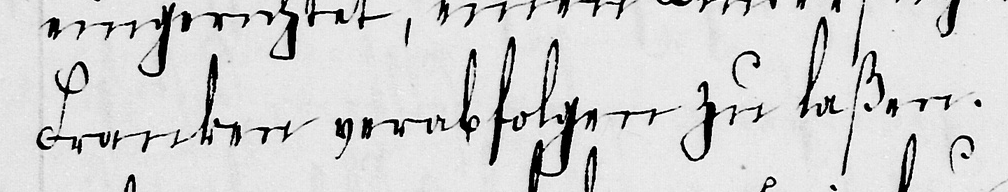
Franken verabfolgen zu laßen.
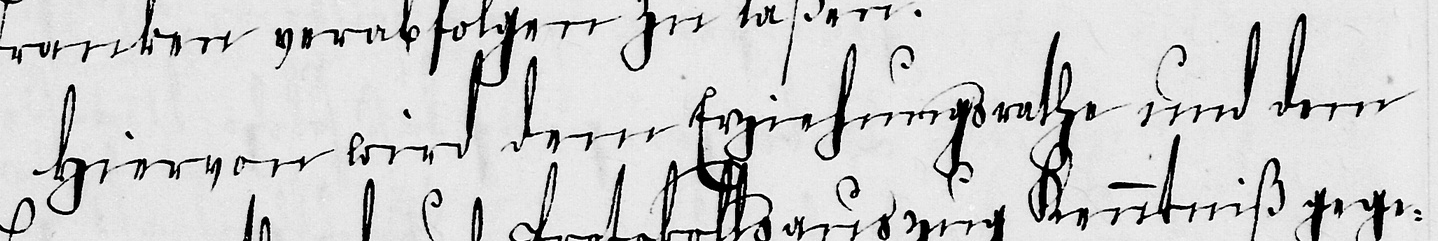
Hiervon wird dem Erziehungsrathe und dem
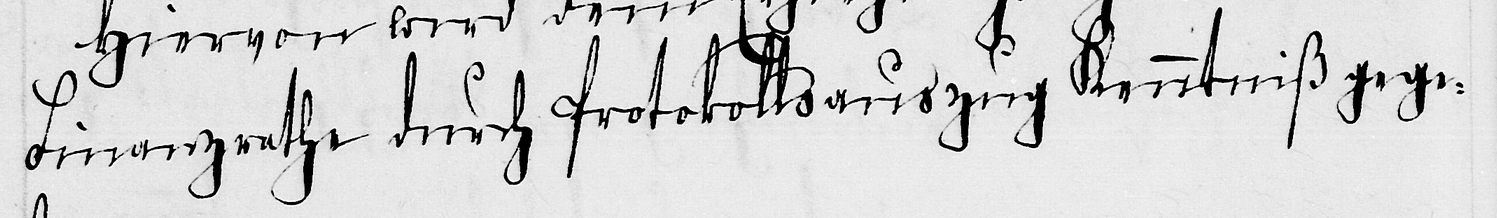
Finanzrathe durch Protokollsauszug Kenntniß gege¬
